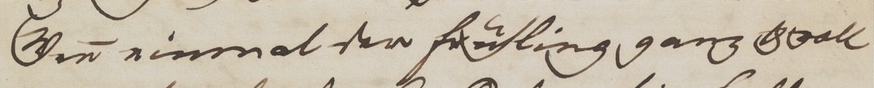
Wenn einmal der Frühling ganz & voll
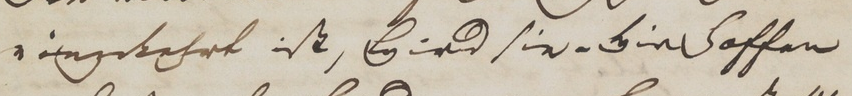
eingekehrt ist, wird sie – wir hoffen
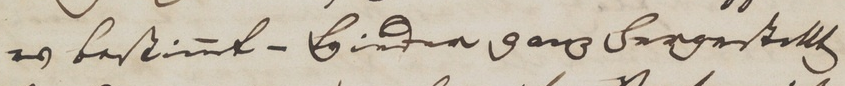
es bestimmt – wieder ganz hergestellt
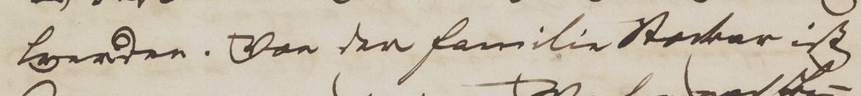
werden. Von der Familie Stockar ist
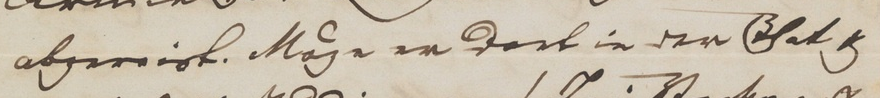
abgereist. Möge er dort in der That &
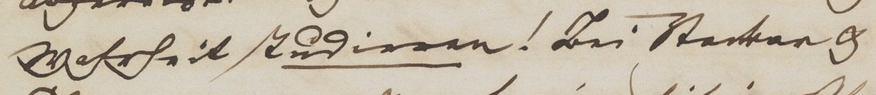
Wahrheit studieren! Bei Stockar &
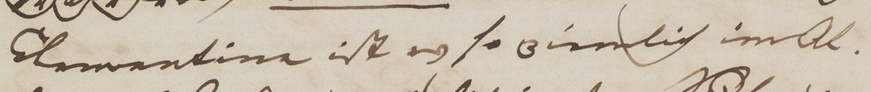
Clementine ist es so ziemlich im Al-
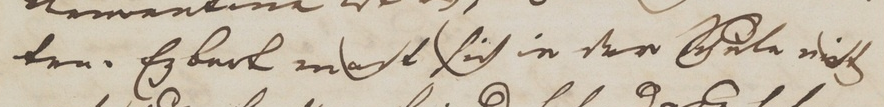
ten. Egbert macht sich in der Schule nicht
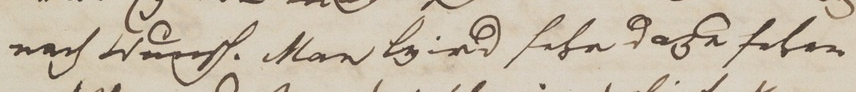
nach Wunsch. Man wird sehr dazu sehen
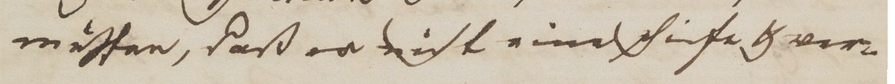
müssen, daß er nicht eine schiefe & ver-
